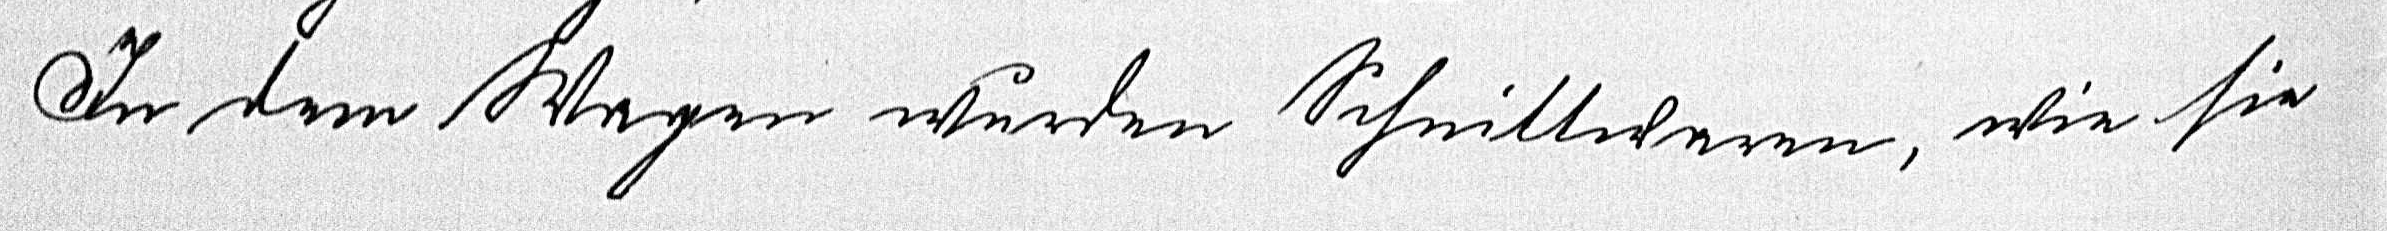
In dem Wagen wurden Schnitttwaren, wie sie
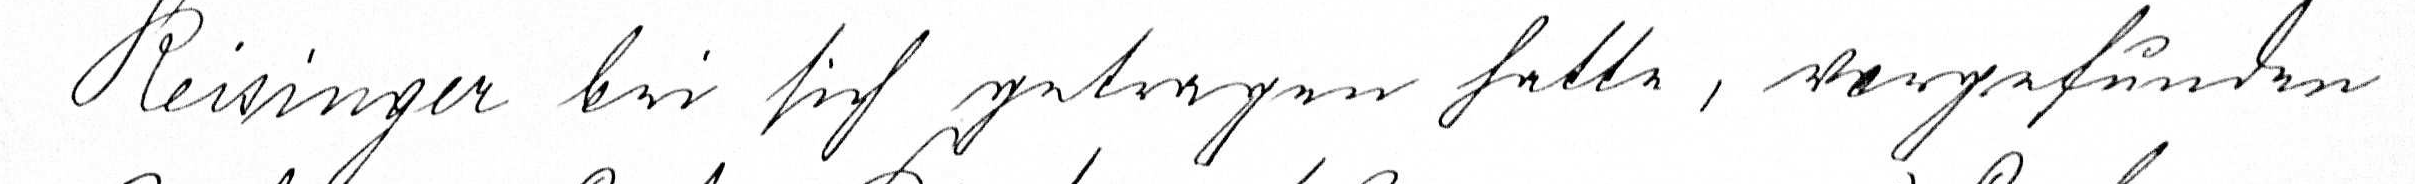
Reisinger bei sich getragen hatte, vorgefunden
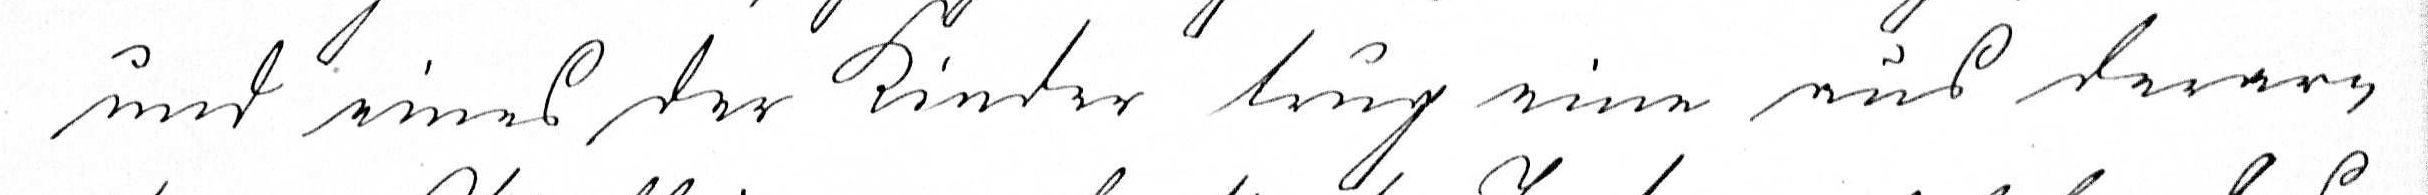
und eines der Kinder trug eine aus derar¬
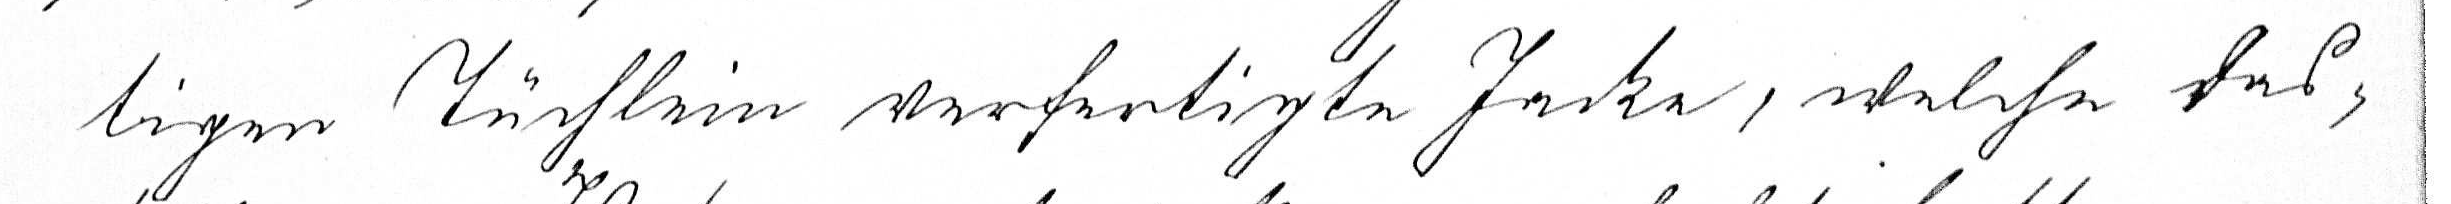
tigen Tüchlein verfertigte Jacke, welche des¬
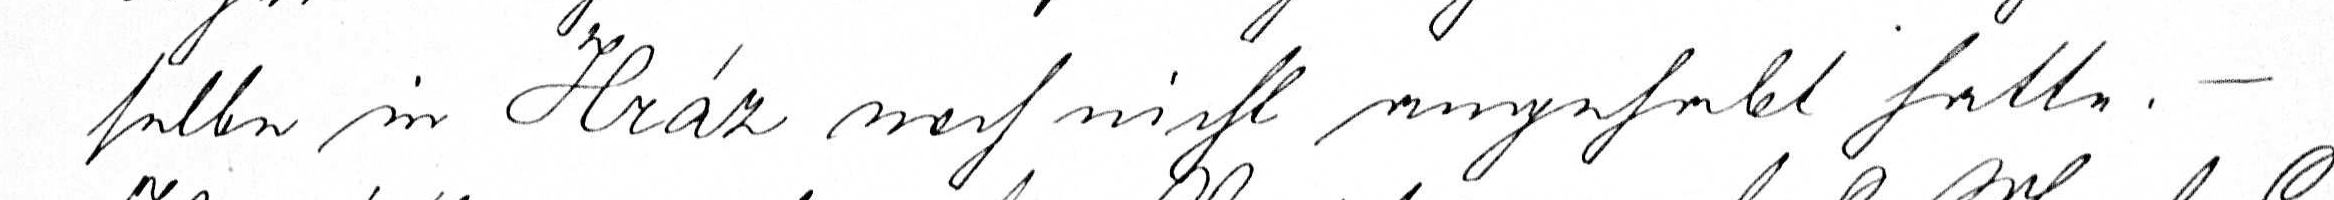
selbe in Hráz noch nicht angehabt hatte.–
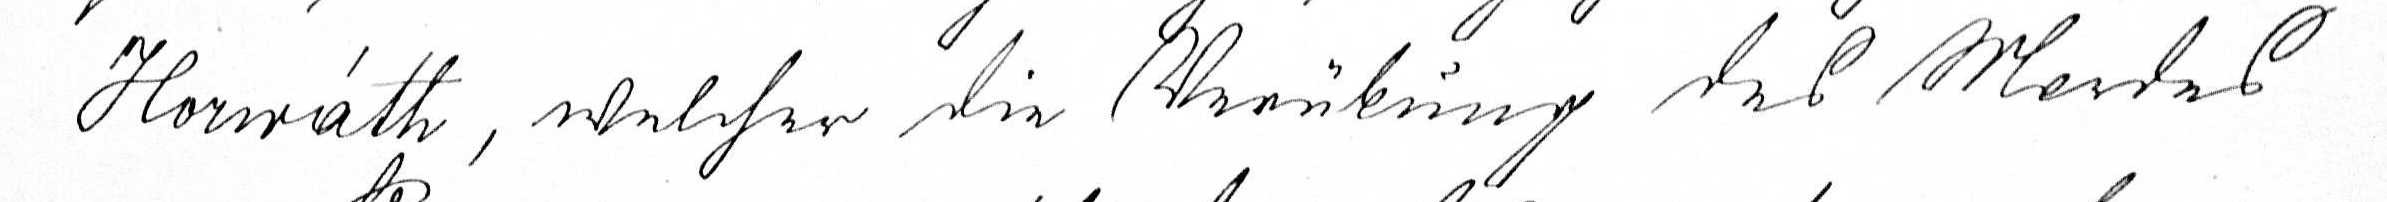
Horwáth, welcher die Verübung des Mordes
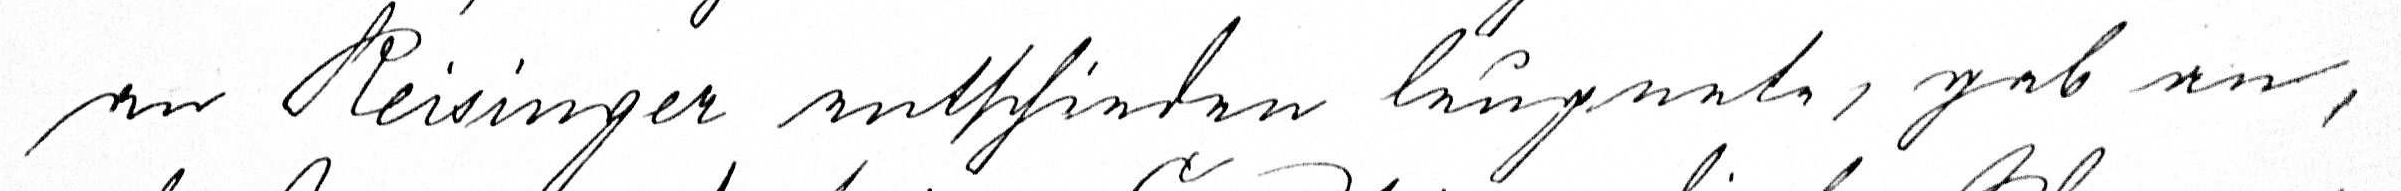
an Reisinger entschieden leugnete, gab an,
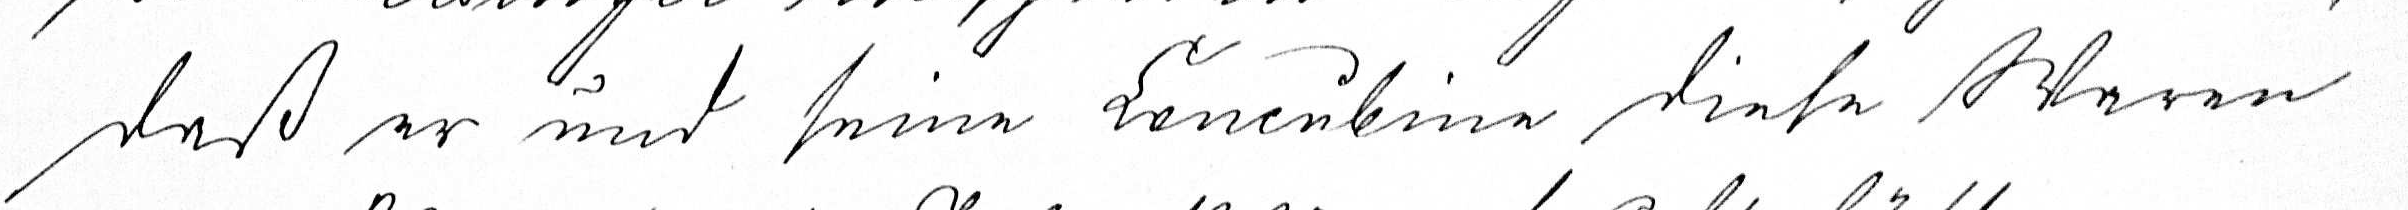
daß er und seine Concubine diese Waren
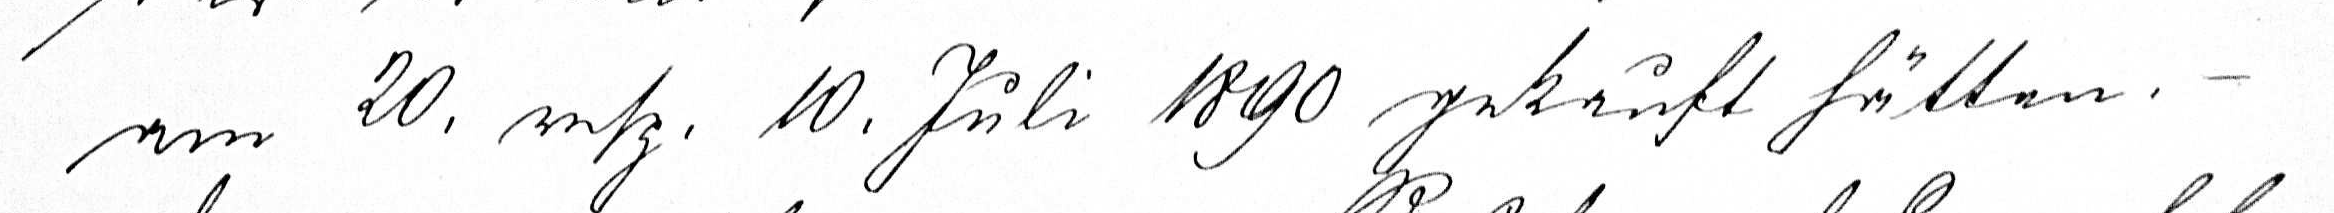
am 20. Resp. 10. Juli 1890 gekauft hätten.–
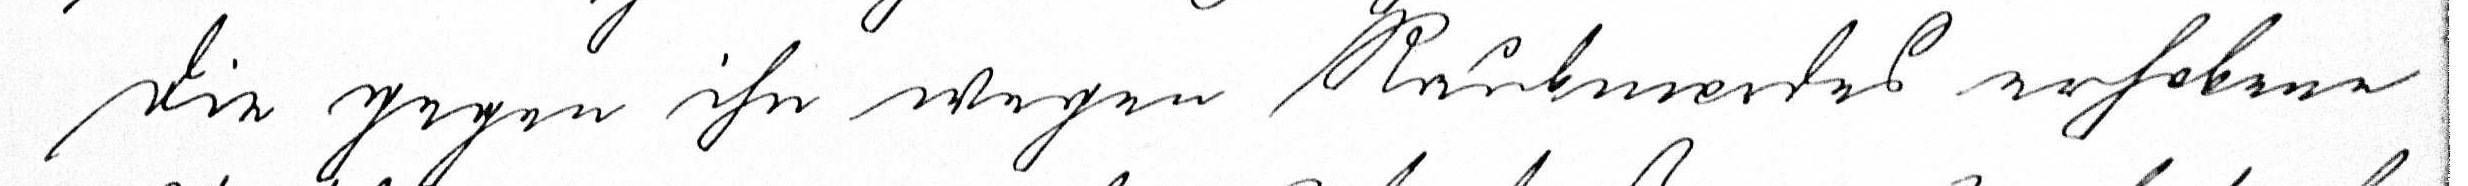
Die gegen ihn wegen Raubmordes erhobene
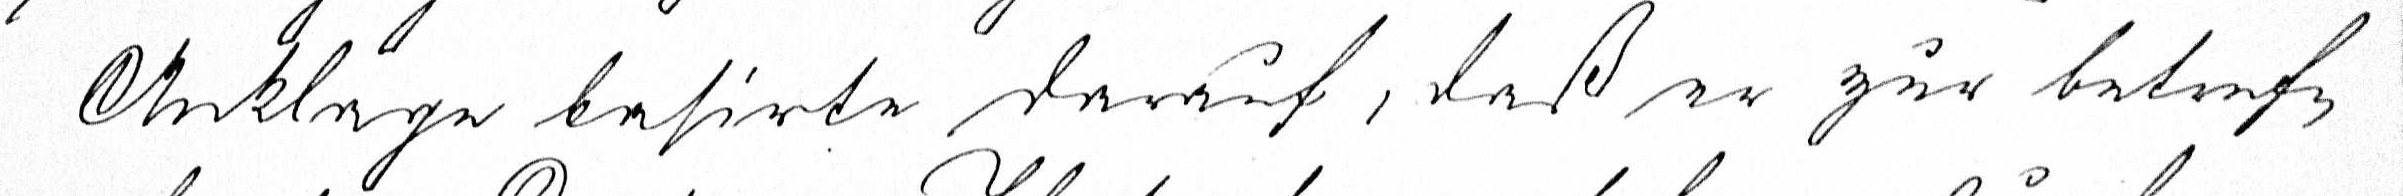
Anklage basirte darauf, das er zur betref¬
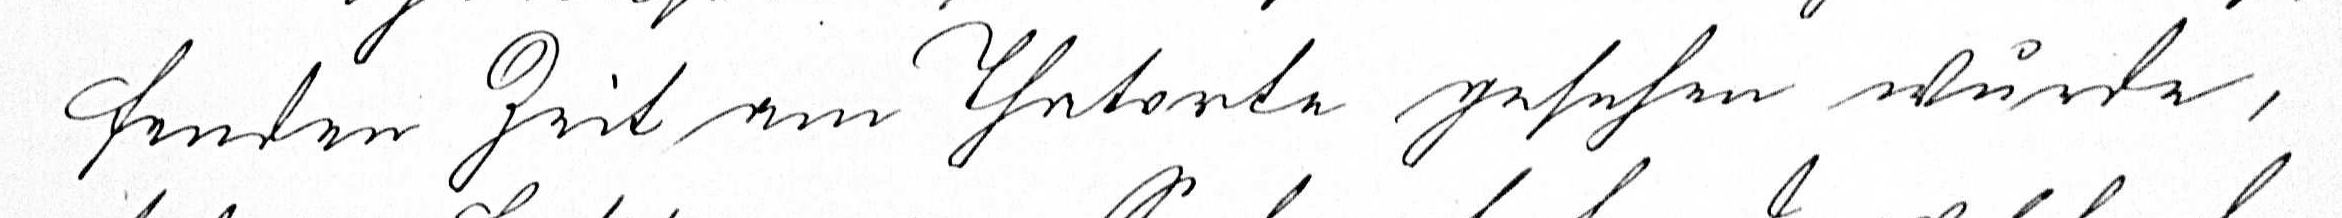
fenden Zeit am Thatorte gesehen wurde,
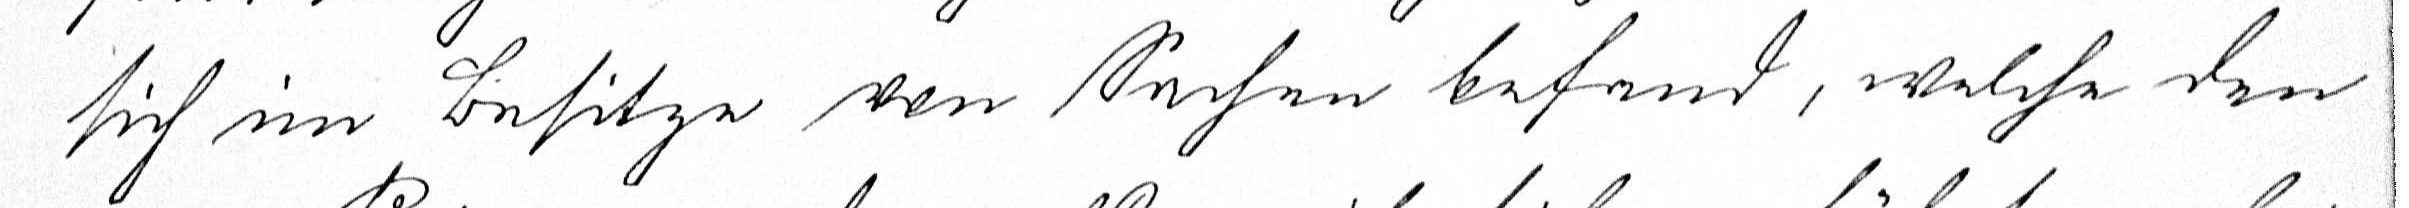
sich ein Besitze von Sachen befand, welche den
